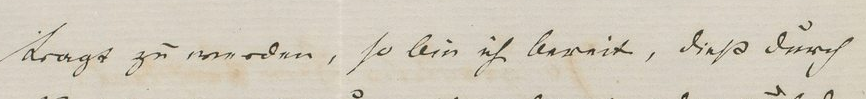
tragt zu werden, so bin ich bereit, dieß durch
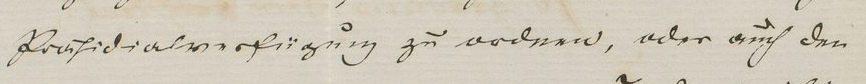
Präsidialverfügung zu ordnen, oder auch den
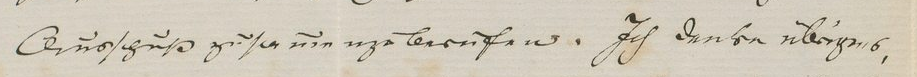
Ausschuß zusammen zu berufen. Ich denke übrigens,
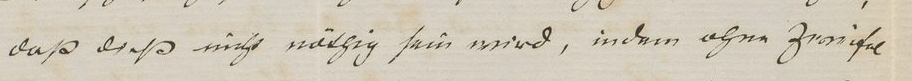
daß dieß nicht nöthig sein wird, indem ohne Zweifel
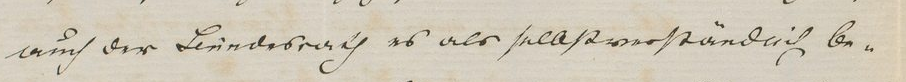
auch der Bundesrath es als selbstverständlich be-
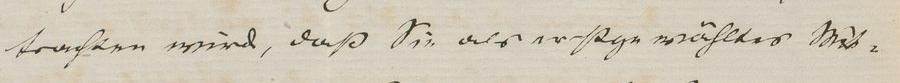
trachten wird, daß Sie als erstgewähltes Mit-
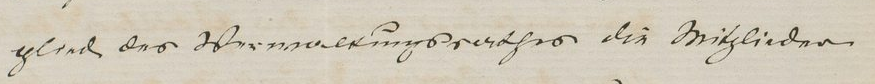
glied des Verwaltungsrathes die Mitglieder
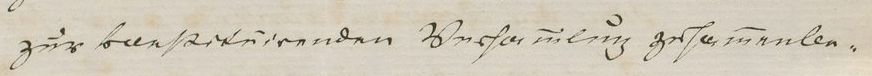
zur konstituirenden Versammlung zusammenbe-
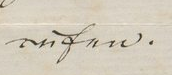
rufen. –
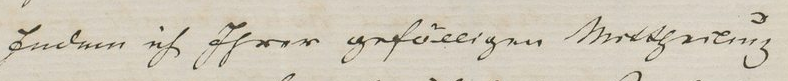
Indem ich Ihrer gefälligen Mittheilung
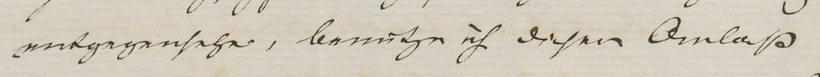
entgegensehe, benütze ich diesen Anlaß
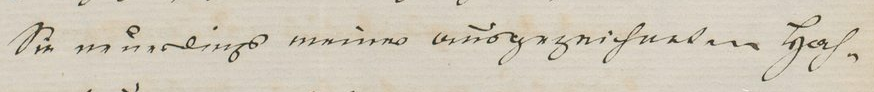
Sie neuerdings meiner ausgezeichneten Hoch-
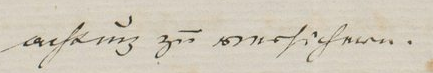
achtung zu versichern.
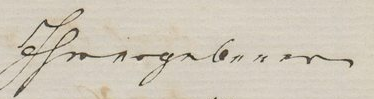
Ihr ergebener
